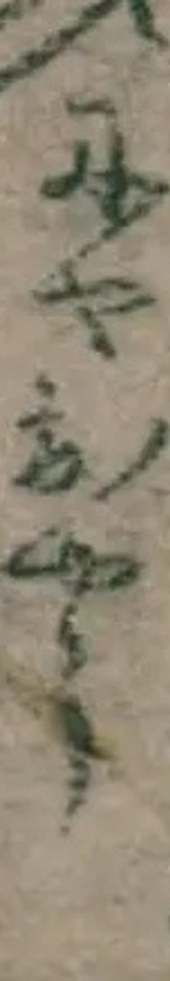にや出やう
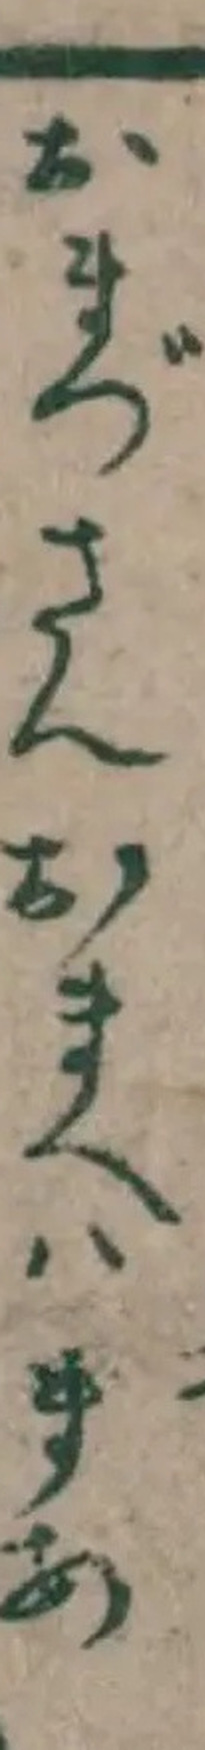おまづさんおまへはまあ
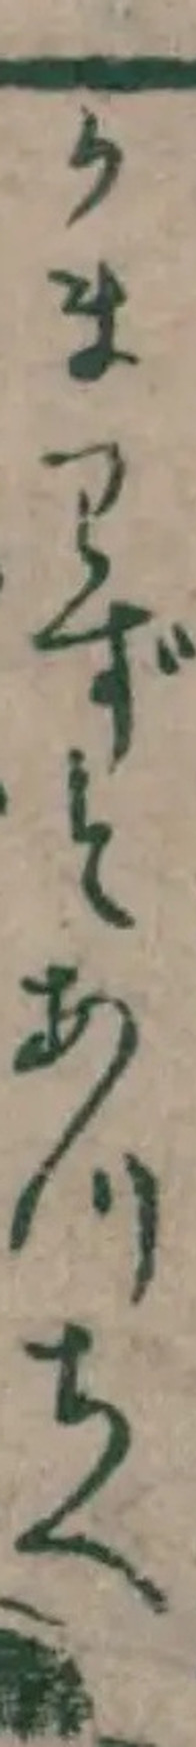かまわずとあつちへ
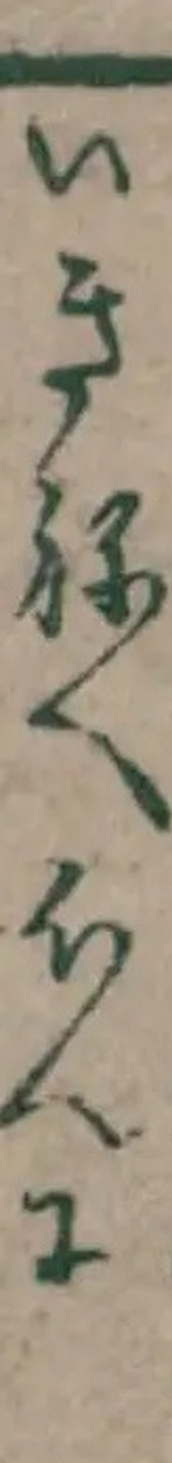いきねへほんに

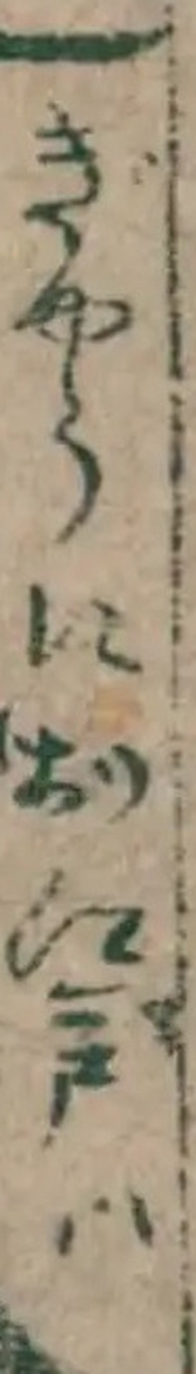ぎやうにお江戸は
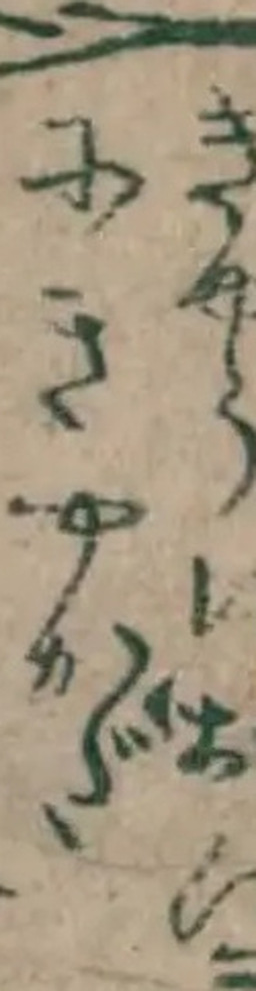にきやかだ
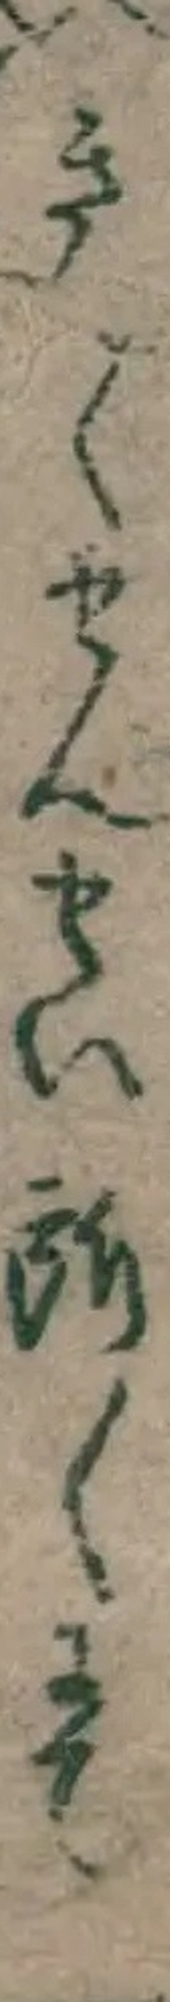きん〳〵せんせい所〳〵にて
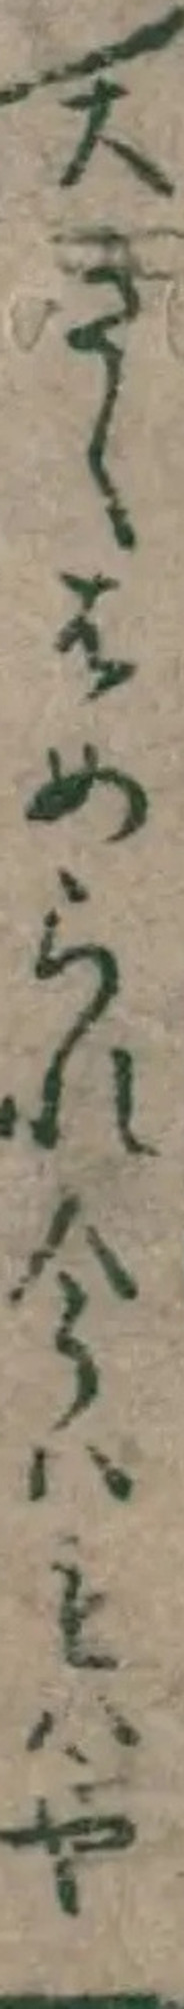大きくはめられ今はもはや
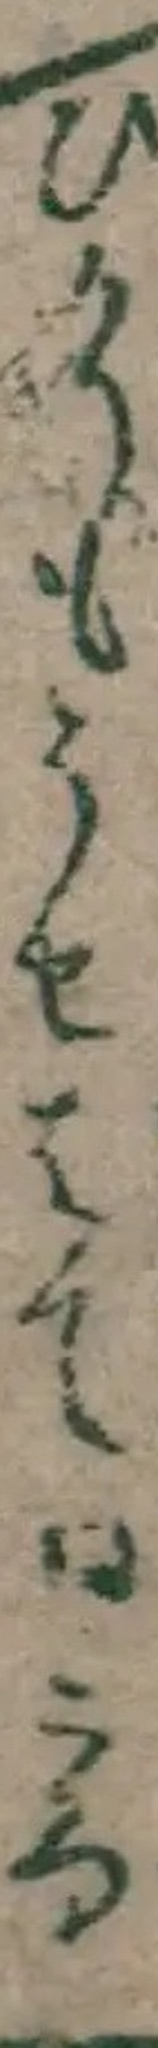ひかりもうせはて日ころ
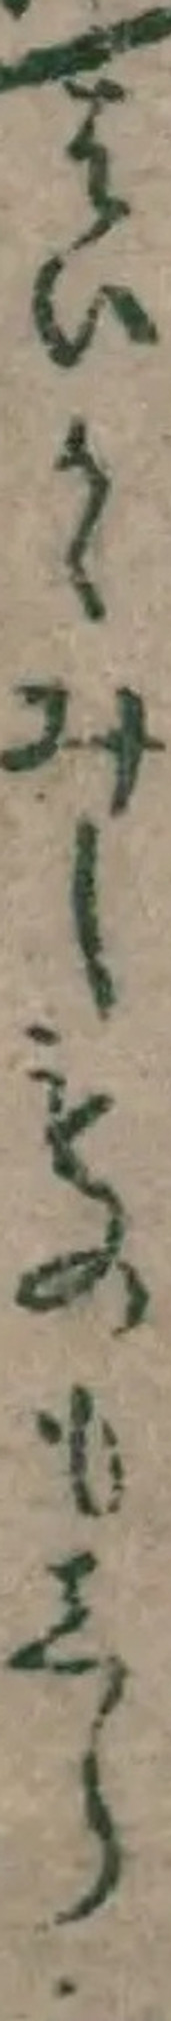はいかゝみしものもしら
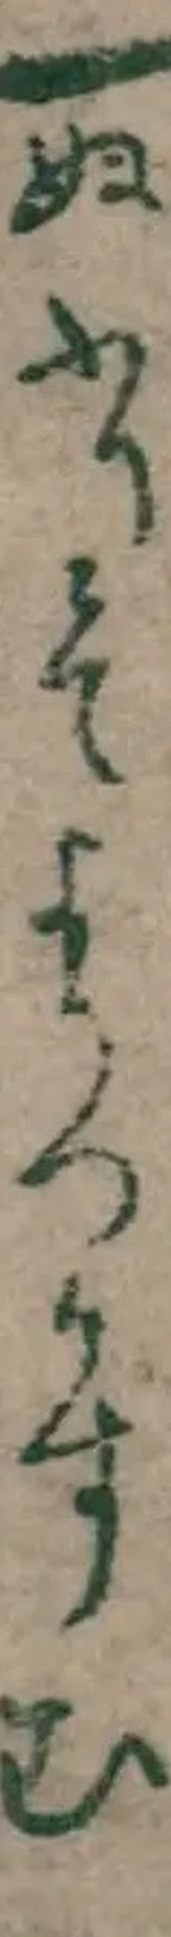ぬふりにてよりつかすむ
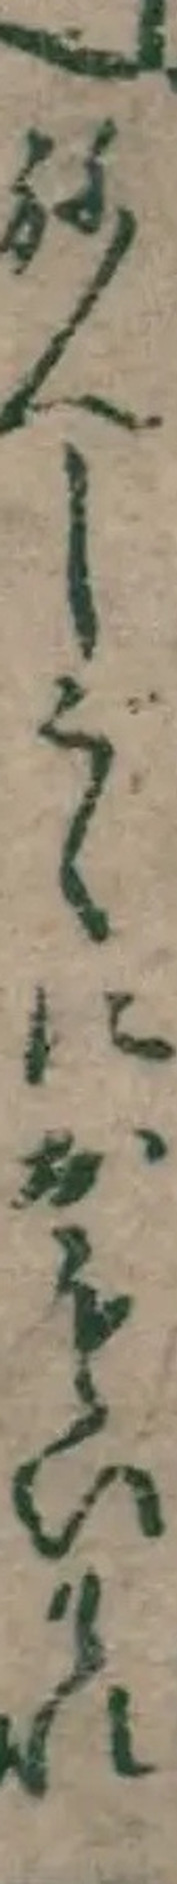ねんしごくにおもいけれ
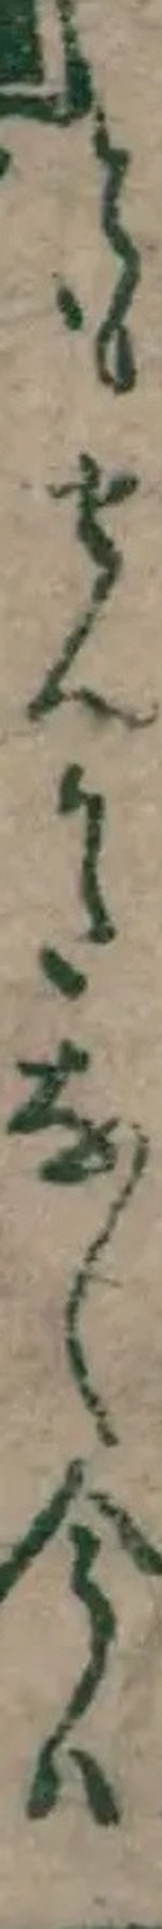ともせんかたなく今は
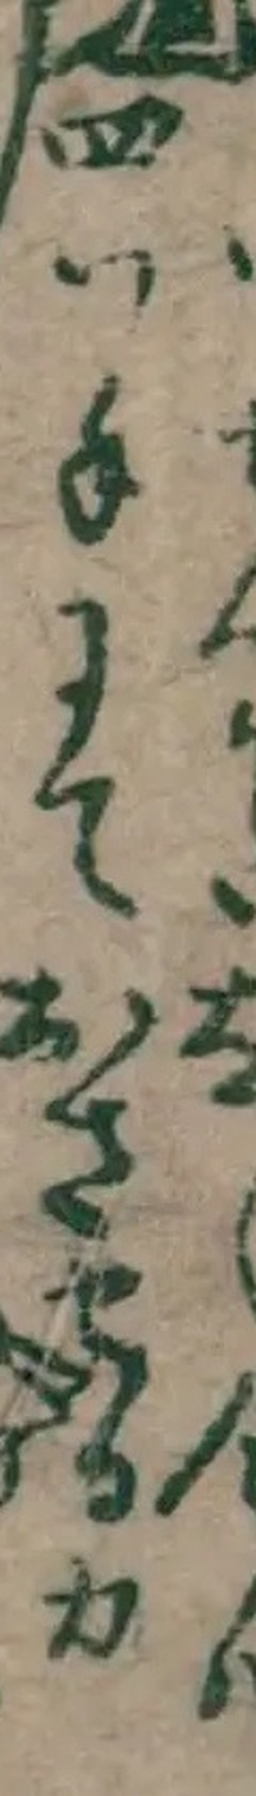四ツ手にて出させる力も
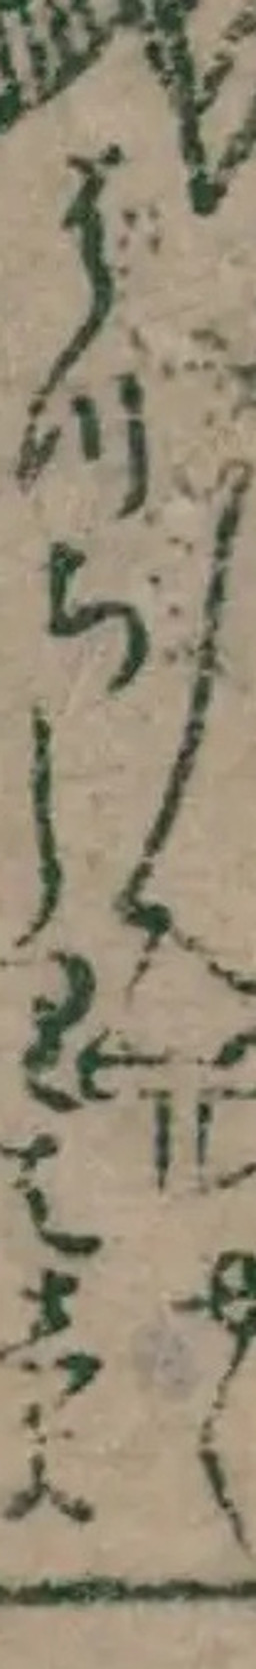はつちしりはしよ
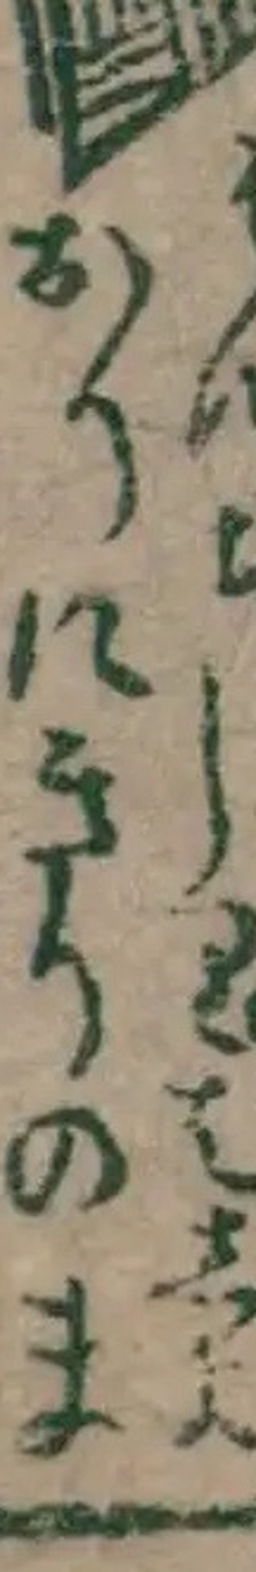おりにきりのま
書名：金々先生栄花夢 : 2巻
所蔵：国立国会図書館 National Diet Library, JAPAN
